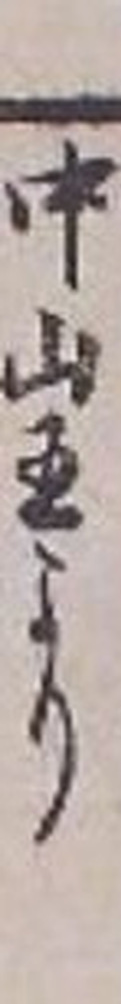中山王より
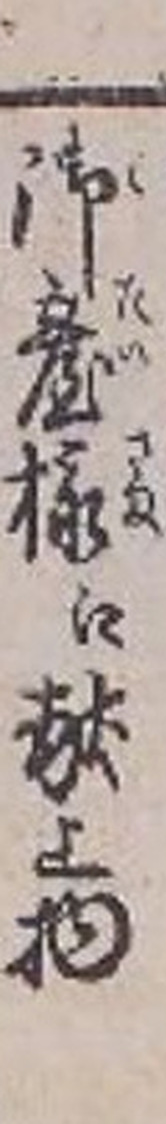御臺様え献上物
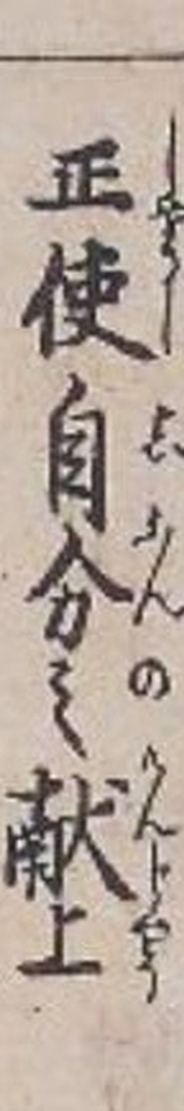正使自分之献上
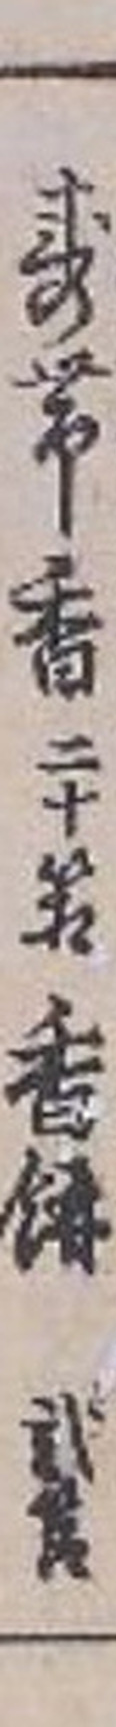寿帯香二十箱香餅弐箱
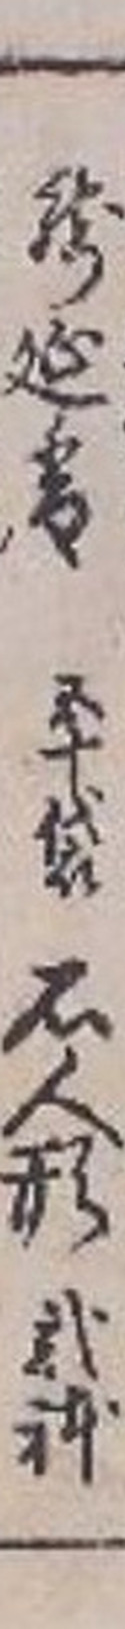龍涎香五十袋石人形弐躰
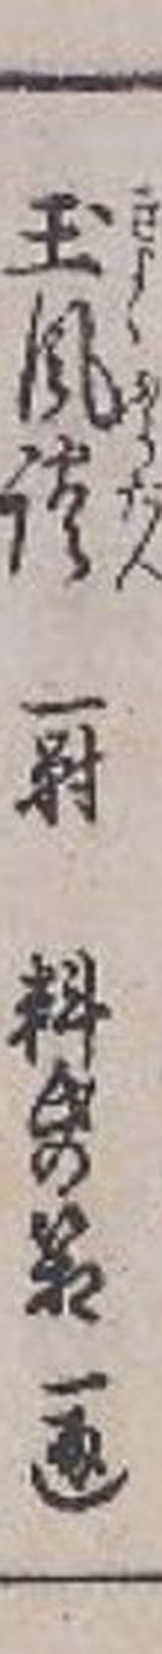玉風談一對料氏の箱一通

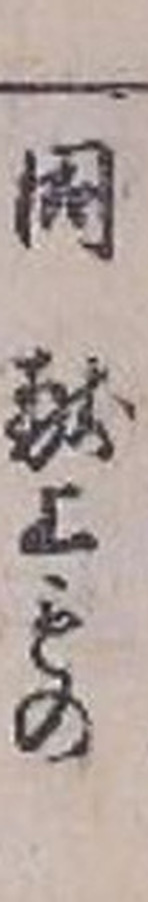同献上もの
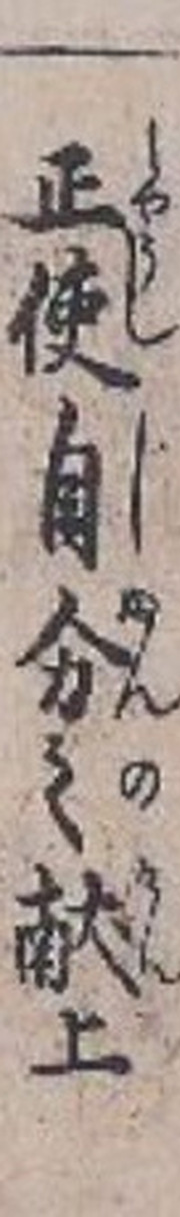正使自分之献上
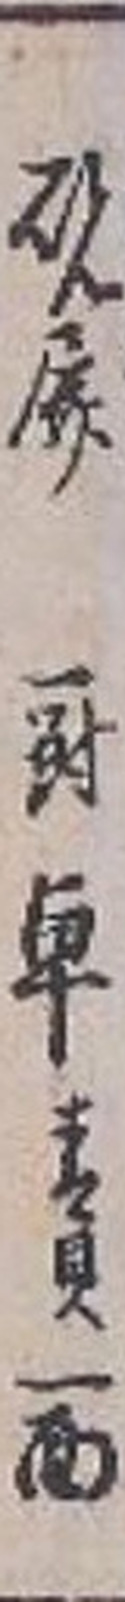硯屏一對卓青貝一面
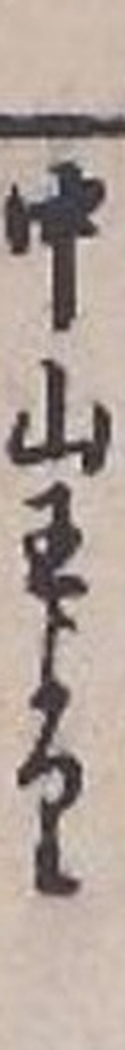中山王より
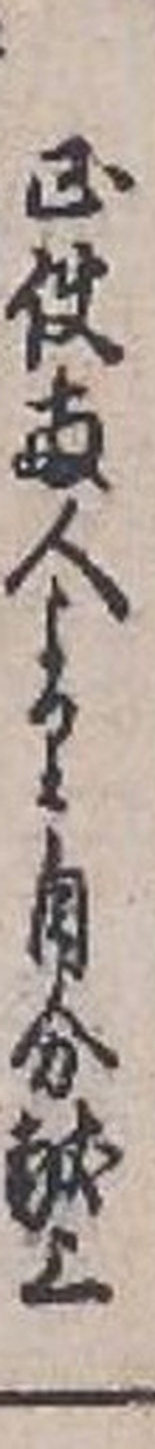正使両人より自分献上
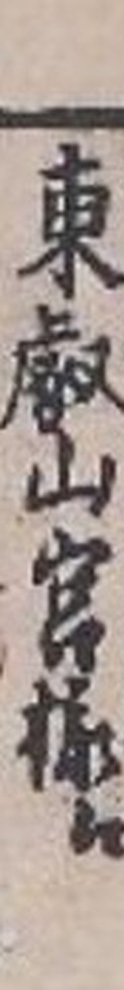東叡山宮様え
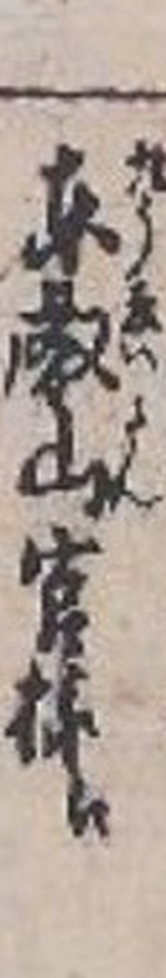東叡山宮様え
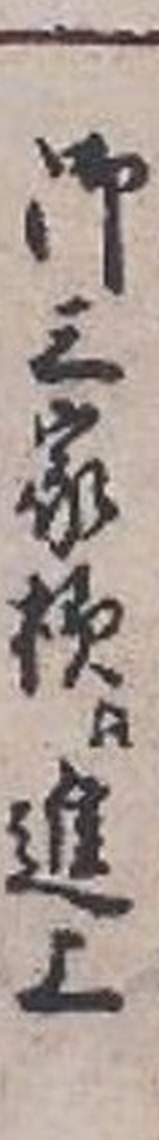御三家様え進上
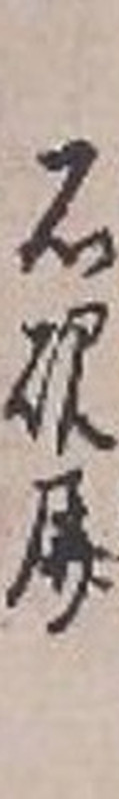石硯屏
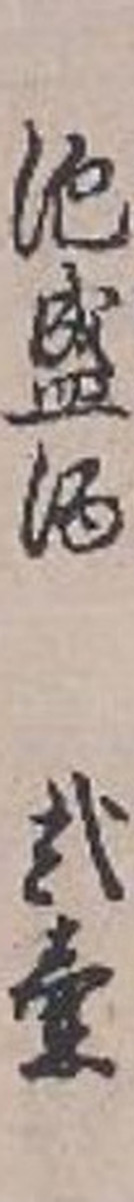泡盛酒弐壺
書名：琉球人大行列記 来朝新板絵入
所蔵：University of the Ryukyus Library
